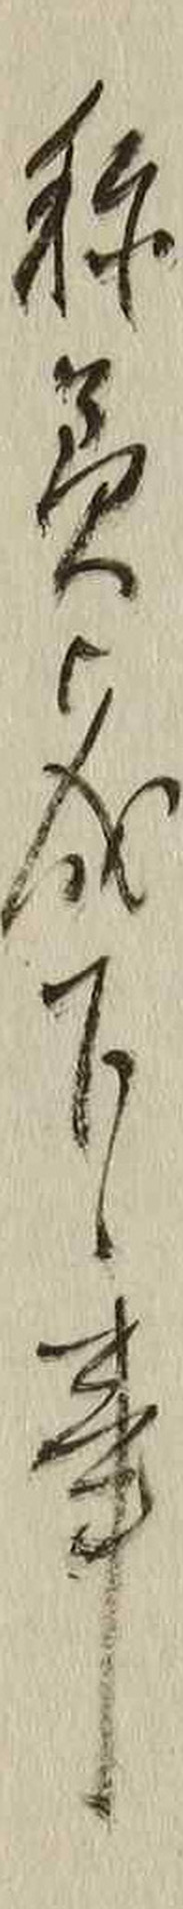称美被成下候事
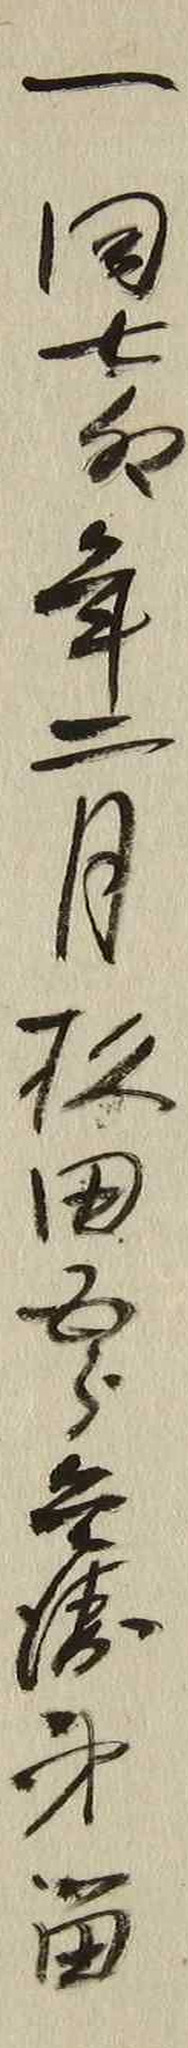一同七卯年二月杉田五郎兵衛弟留
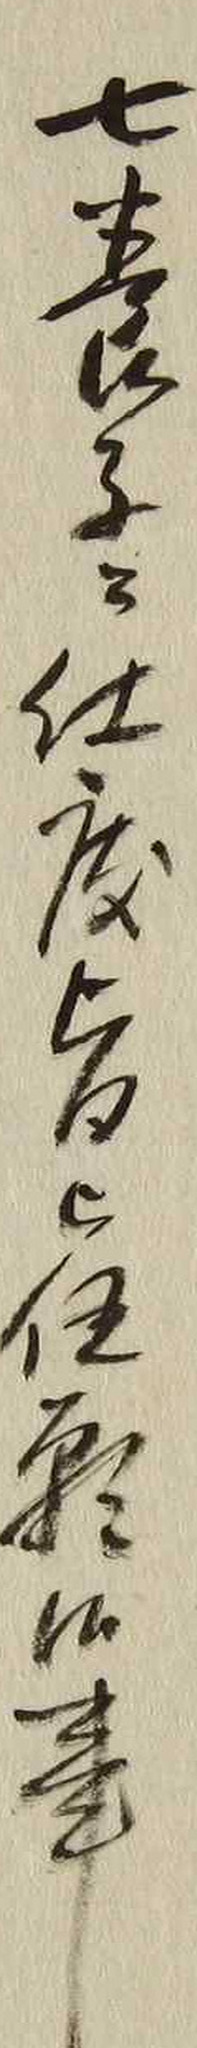七養子ニ仕度旨被任願候事
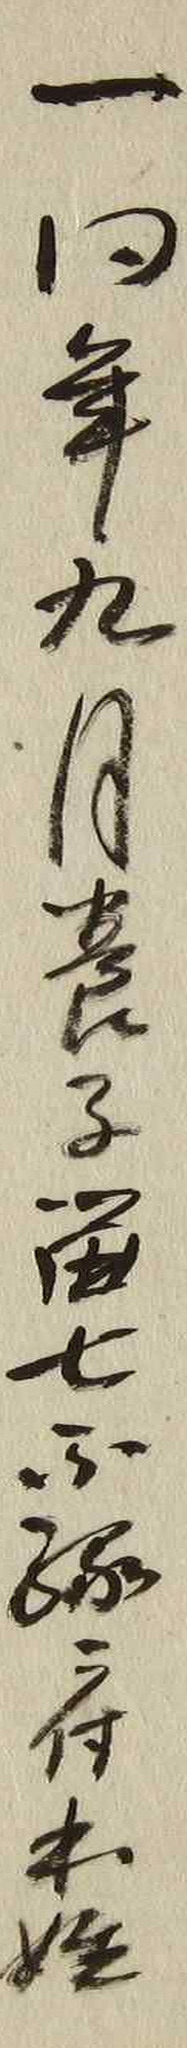一同年九月養子留七不縁ニ付本姓
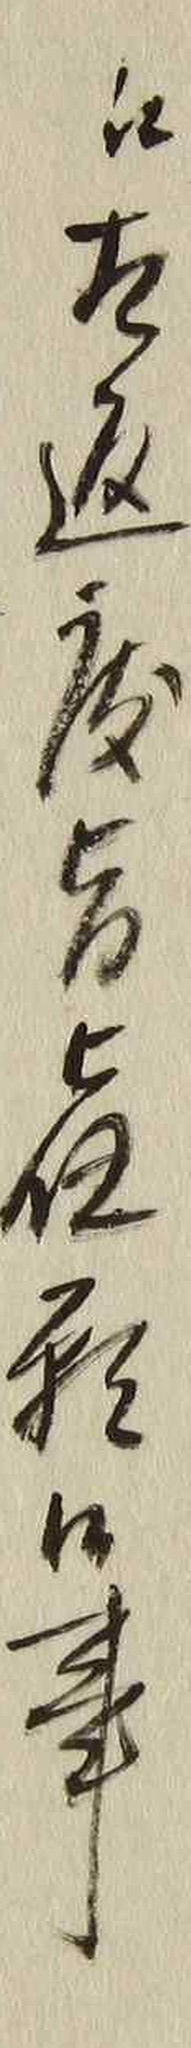江相返度旨被任願候事
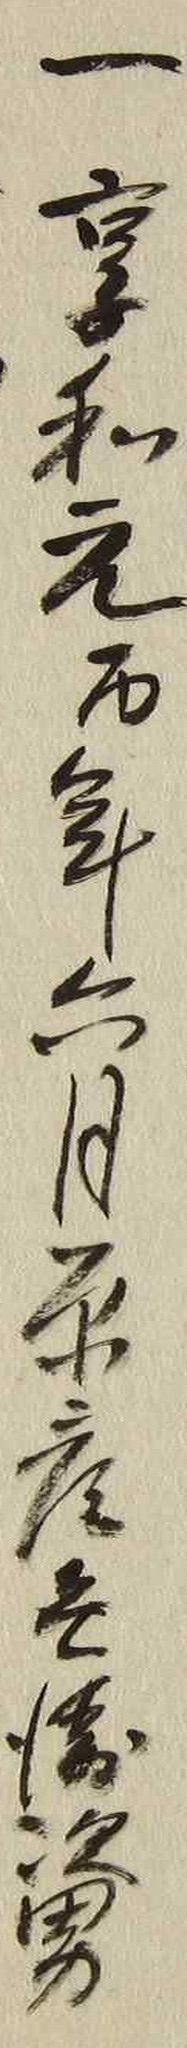一享和元酉年六月原彦兵衛次男
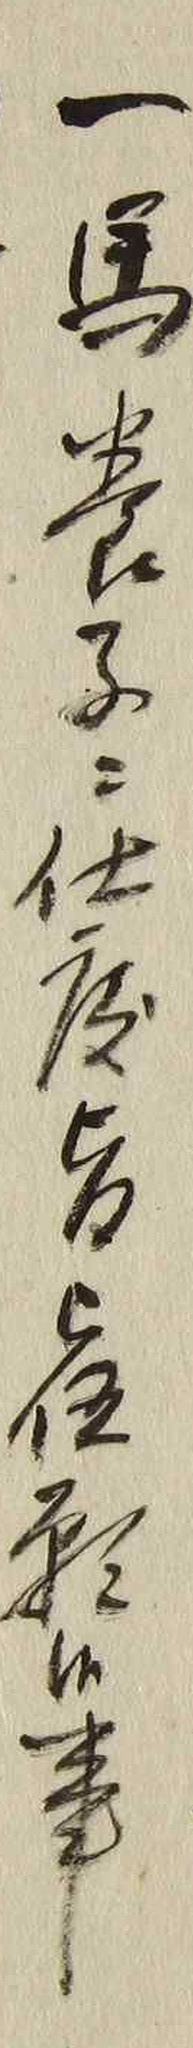一馬養子ニ仕度旨被任願候事
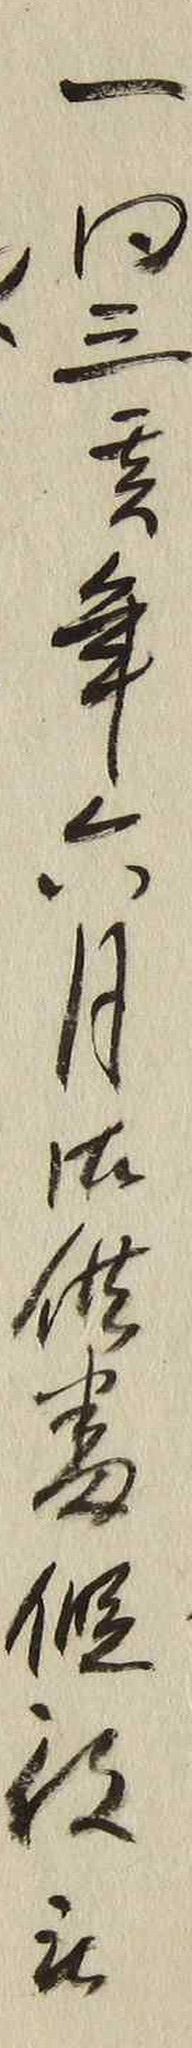一同三亥年六月御供番仮役被
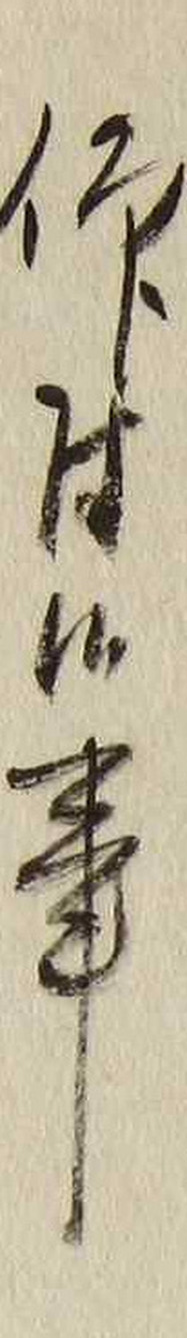仰付候事
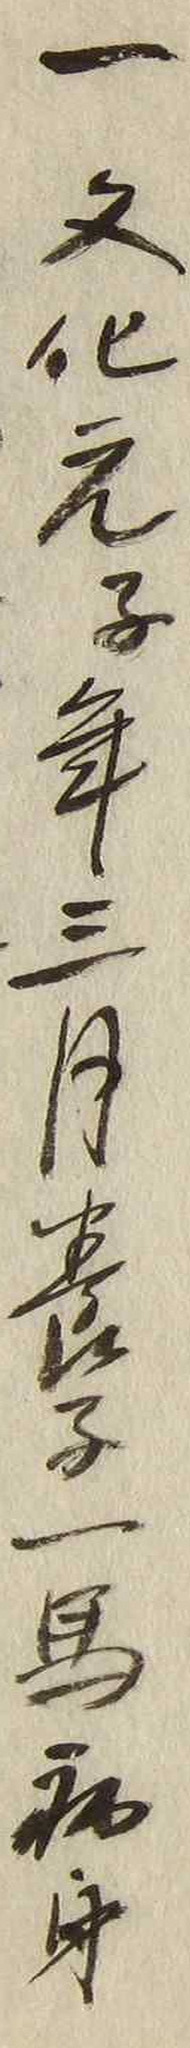一文化元子年三月養子一馬病身
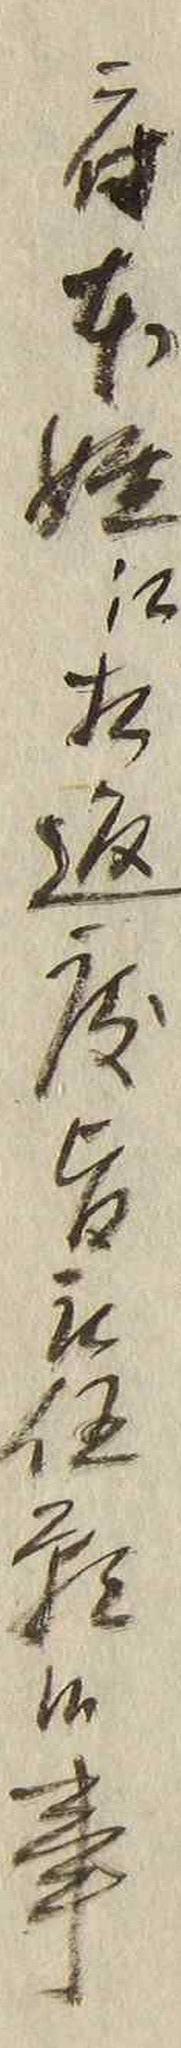ニ付本姓江相返度旨被任願候事

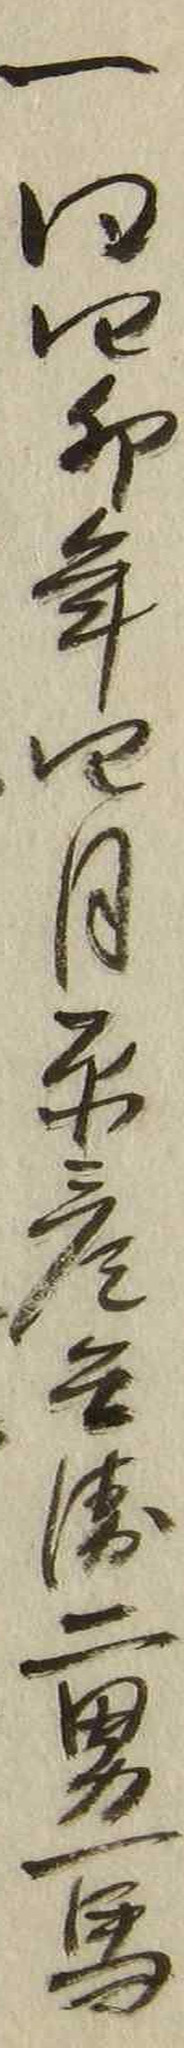一同四卯年四月原彦兵衛二男一馬
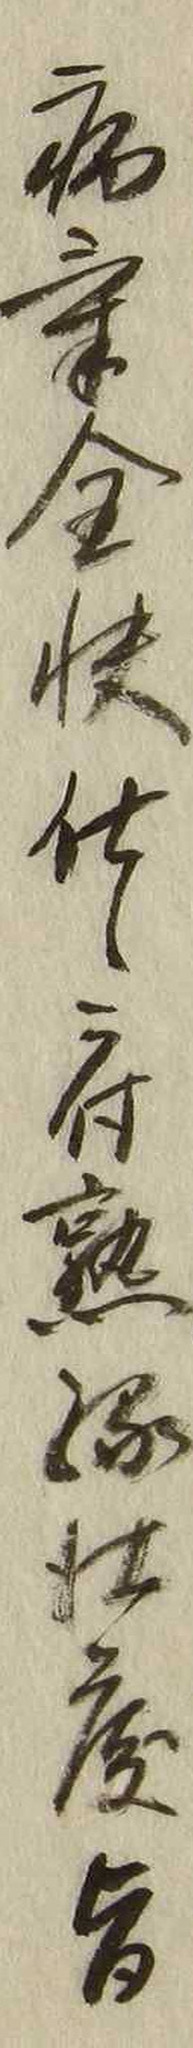病気全快仕候ニ付熟縁仕度旨
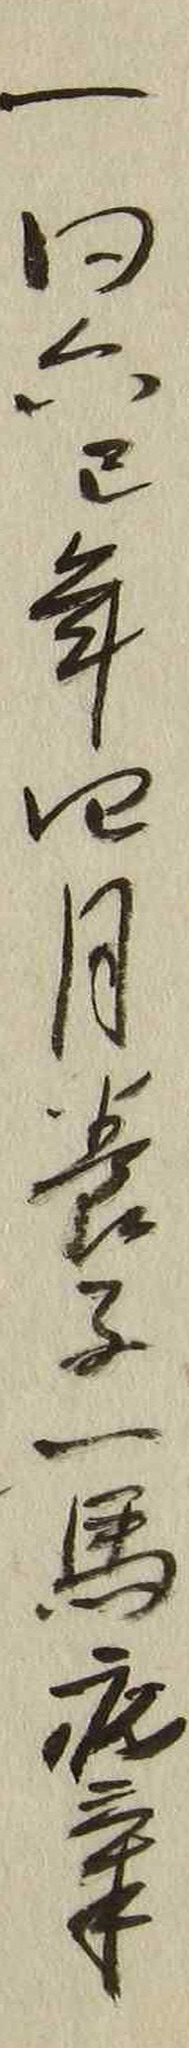一同六巳年四月養子一馬病気
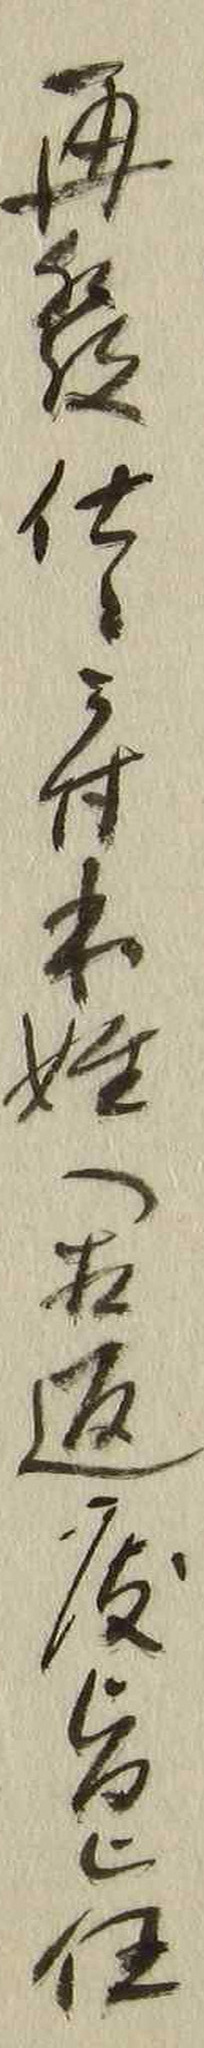再発仕候ニ付本姓へ相返度旨被任
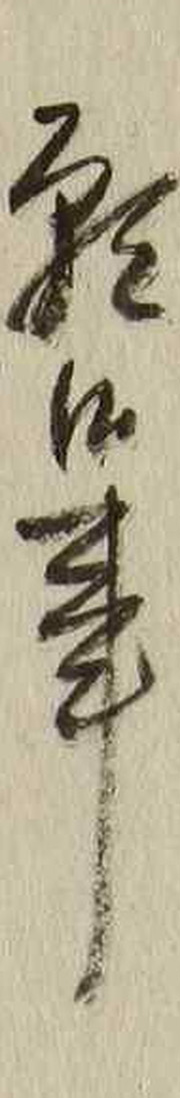願候事
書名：諸士系譜　巻之359　す之部9
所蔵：会津若松市立会津図書館
